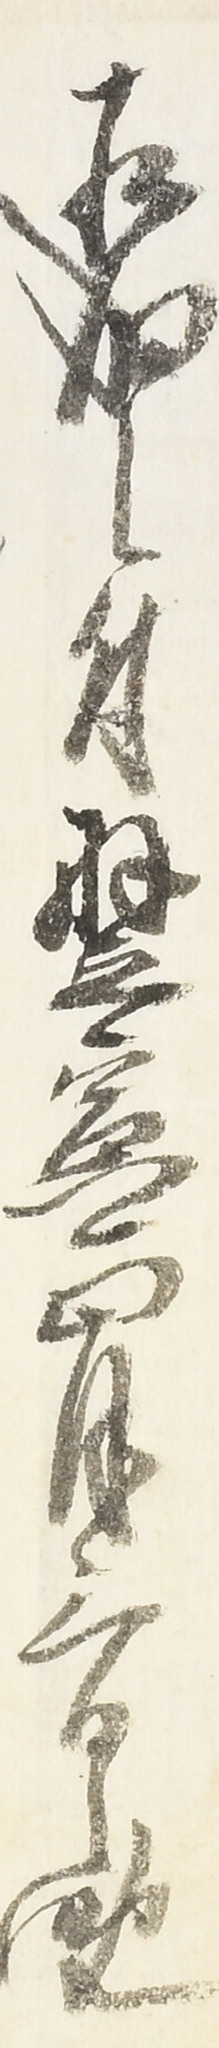相成候ニ付翌寅四月三日之晩
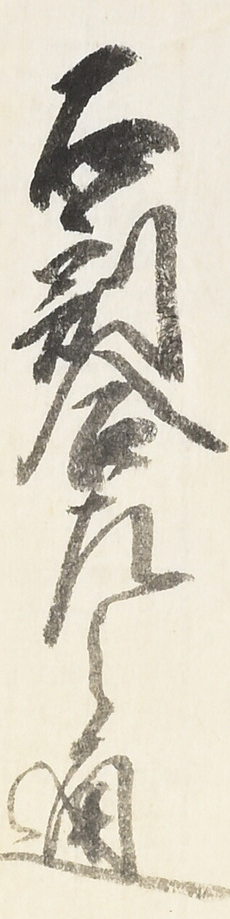右割合左之通
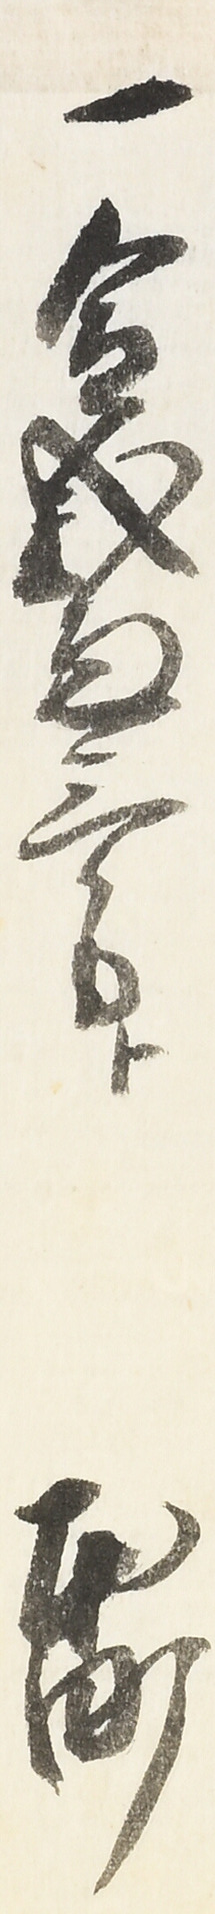一金弐両三分ト本町
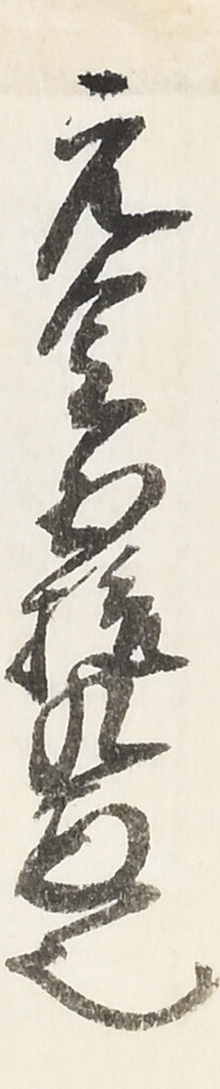元金五拾九両也
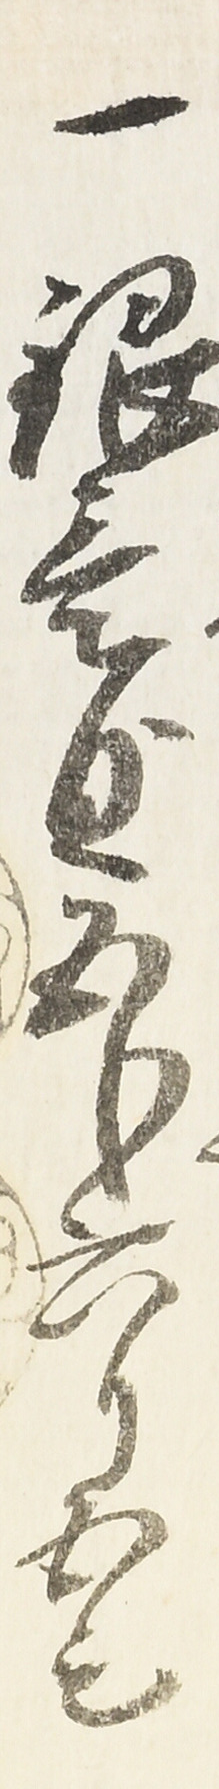一銀壱匁五分六厘五毛
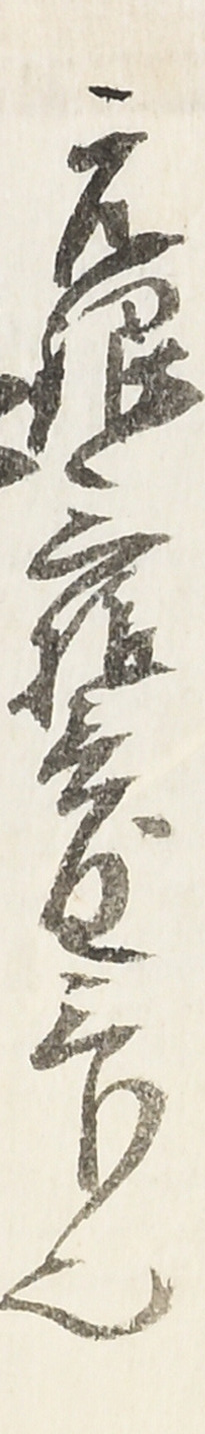元銀三拾壱匁三分也
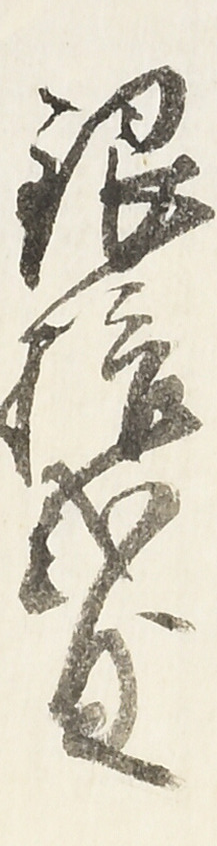銀拾弐匁
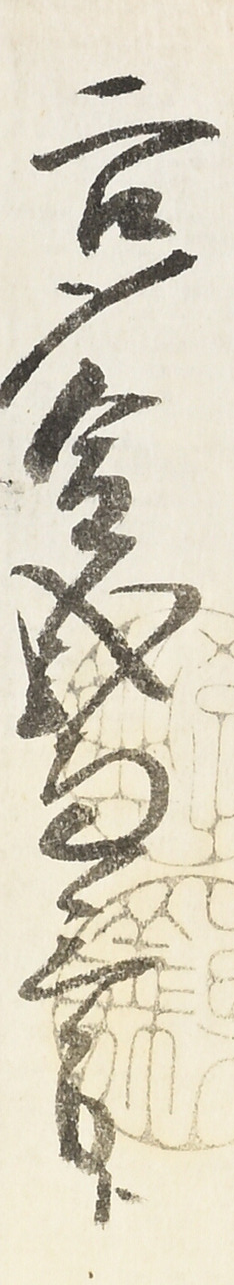二口〆金弐両三分ト
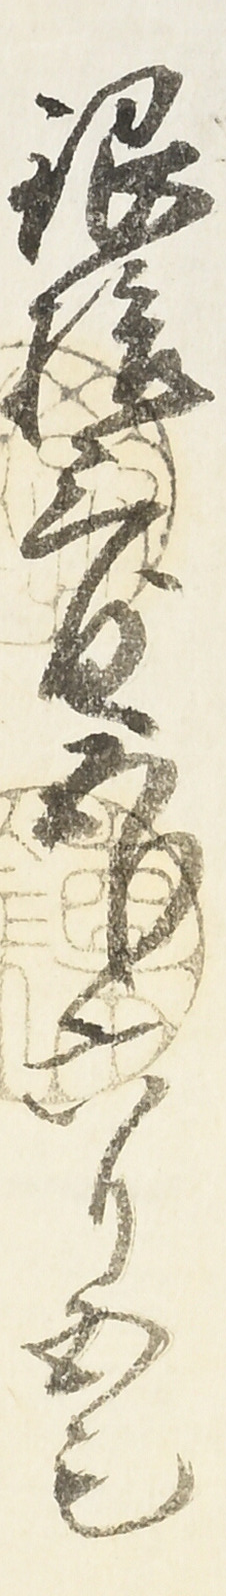銀拾三匁五分六厘五毛
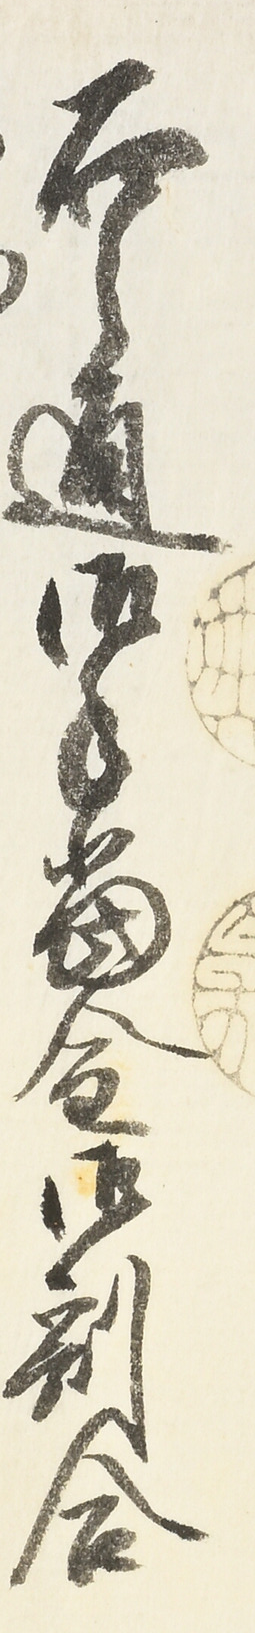右之通御手当金御割合
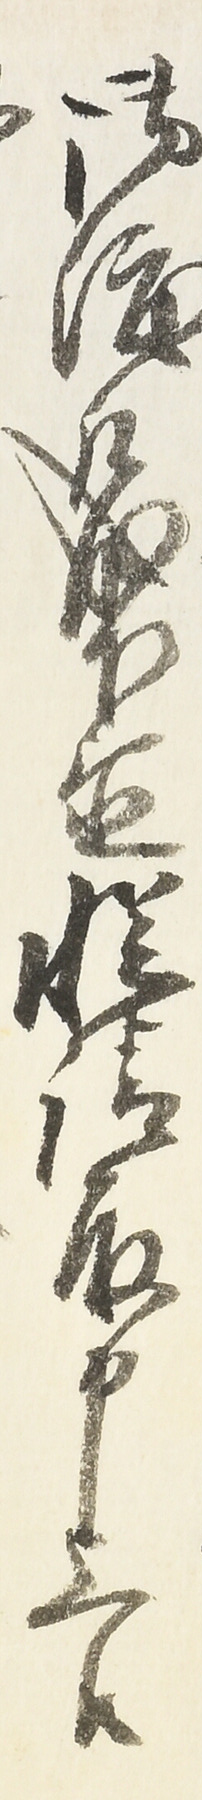御渡被成下置慥請取申上候
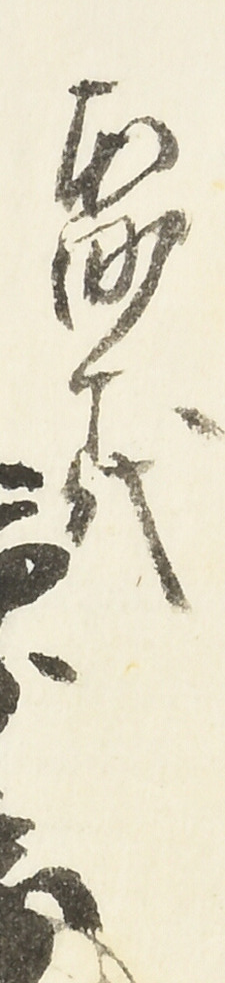本町丁代
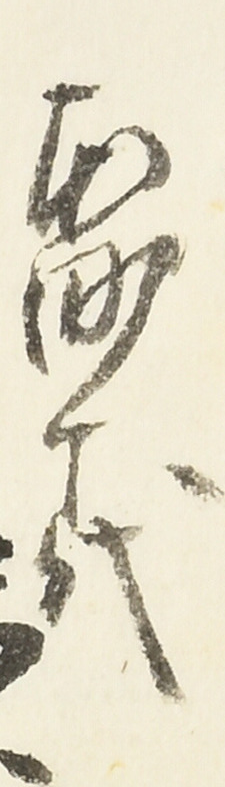本町丁代
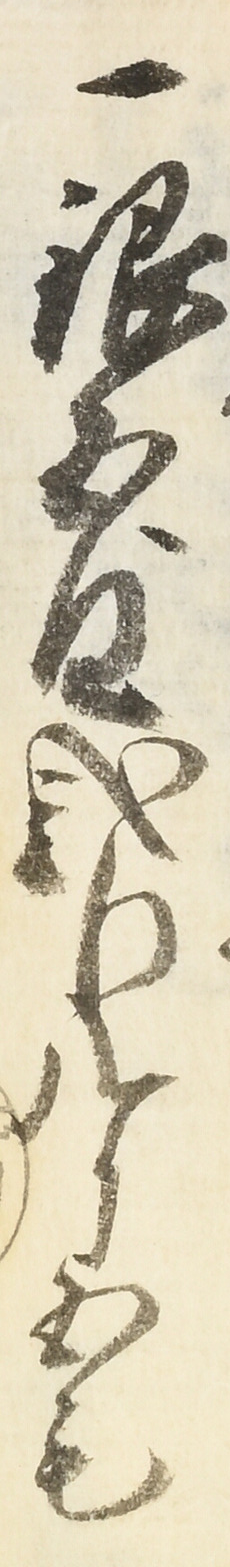一銀壱匁五分六厘五毛

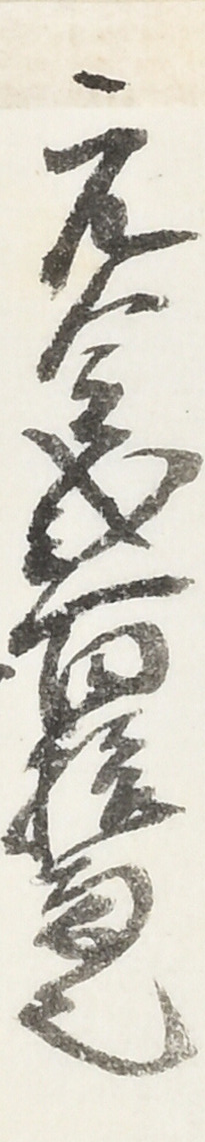元金弐百拾両也
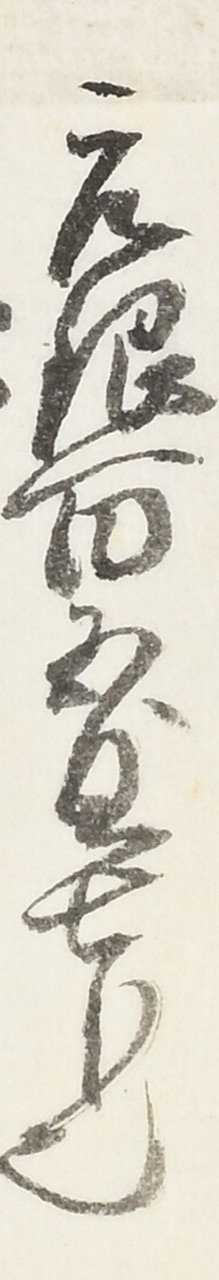元銀百五匁七分也
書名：御才覚金御利足割渡扣帳
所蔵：伊那市立高遠町図書館・合同会社AMANE
